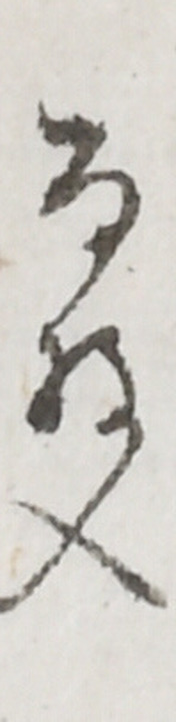百枚入
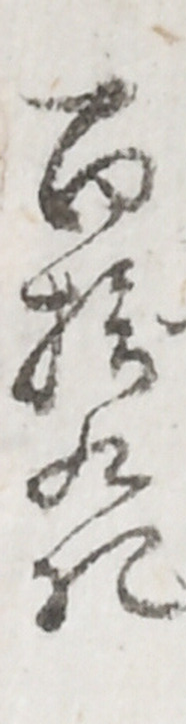百拾九把
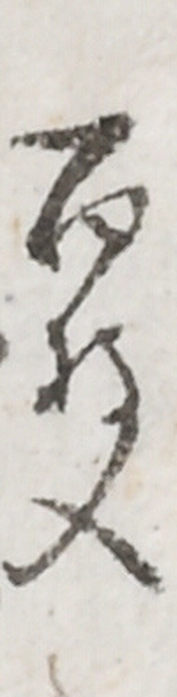百枚入
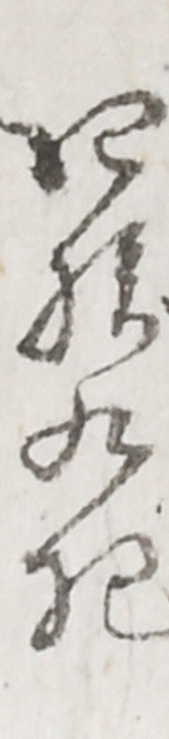四拾九把
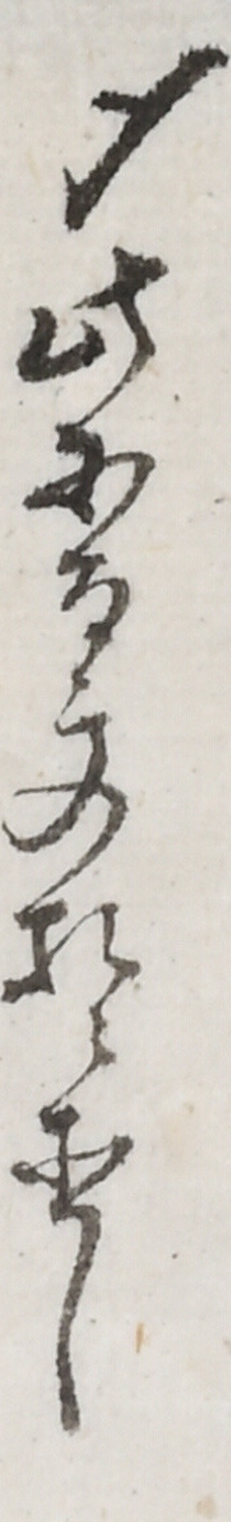〆此五百文札ニ直し
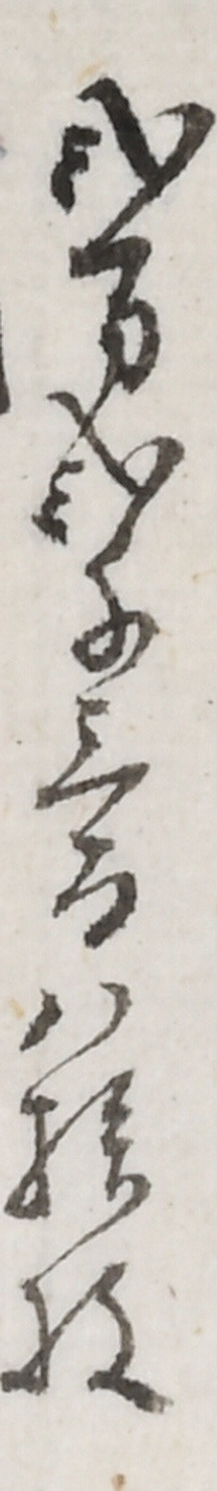弐万弐千三百八拾枚
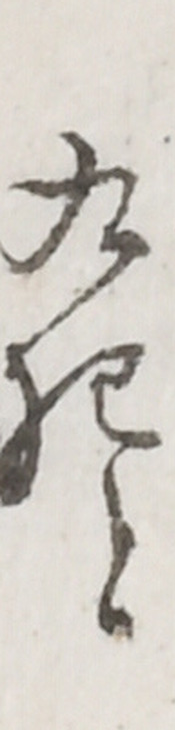九把ニ
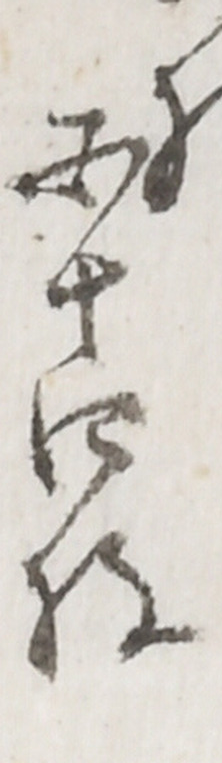五十四枚
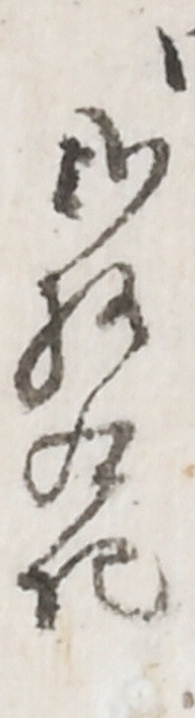弐拾九把
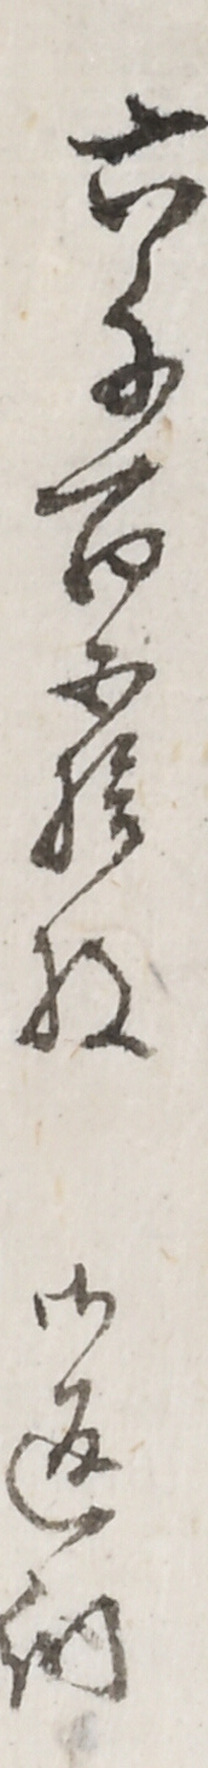六千百五拾枚御返納
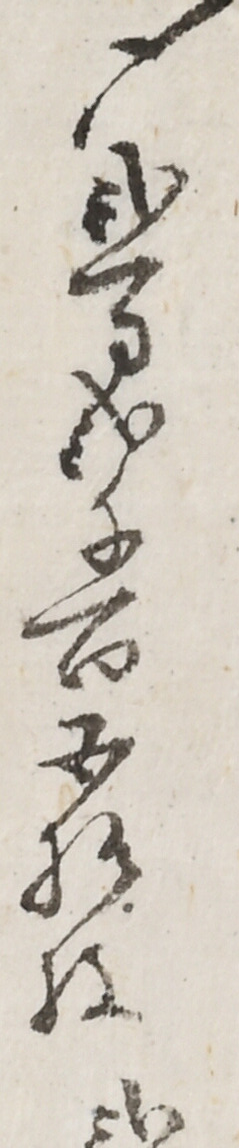〆弐万弐千百五拾枚弐口
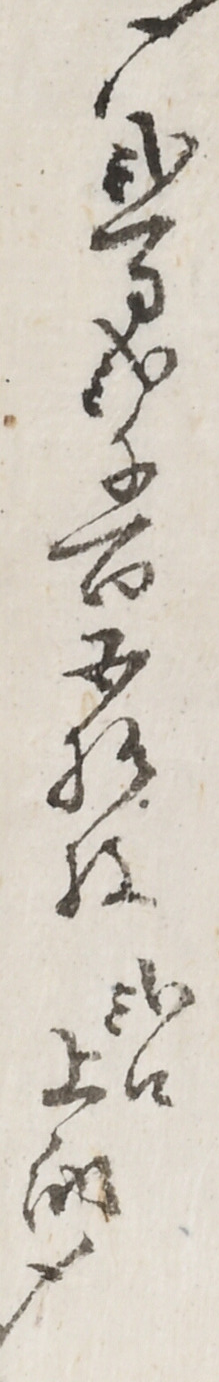〆弐万弐千百五拾枚弐口
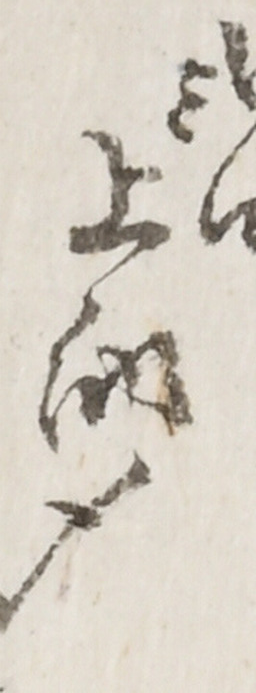上納〆
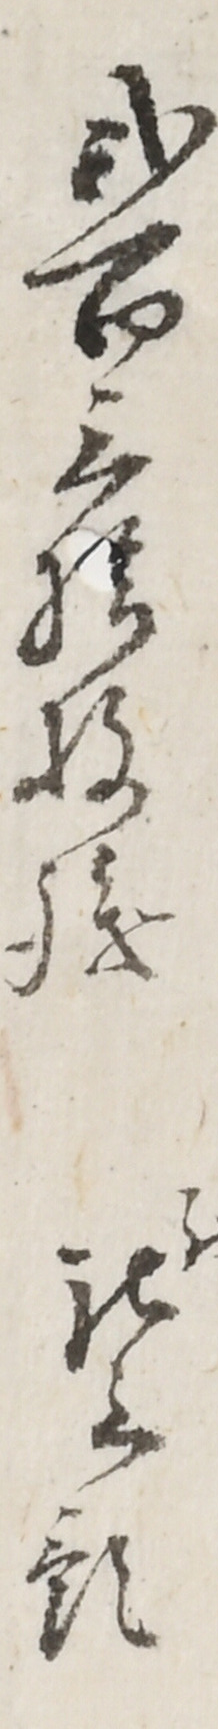弐百三拾枚残池上預
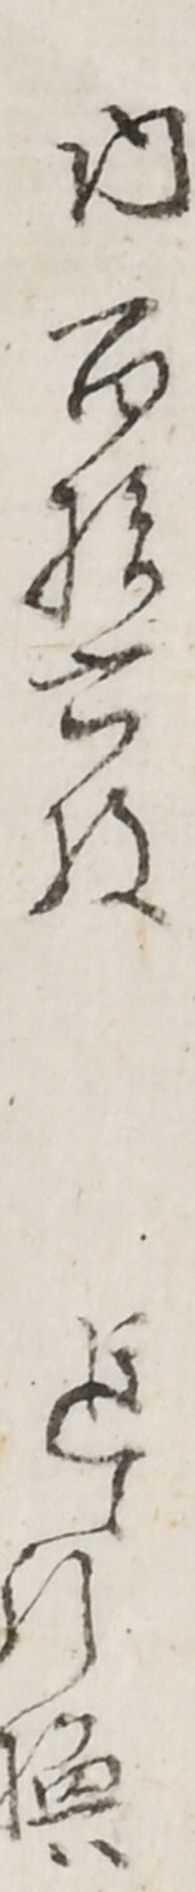内百拾六枚追々引換
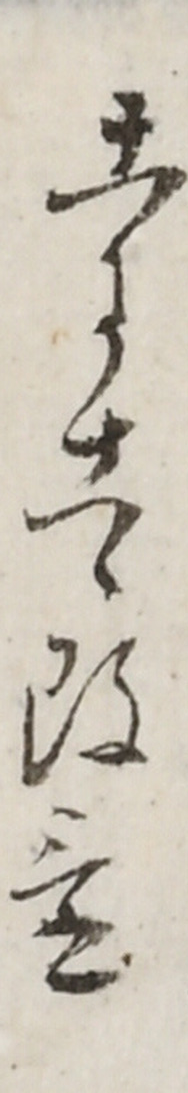十一月十一日改置
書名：髙遠限楮幣引換ニ付御下ケ預諸事控
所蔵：伊那市立高遠町図書館・合同会社AMANE
